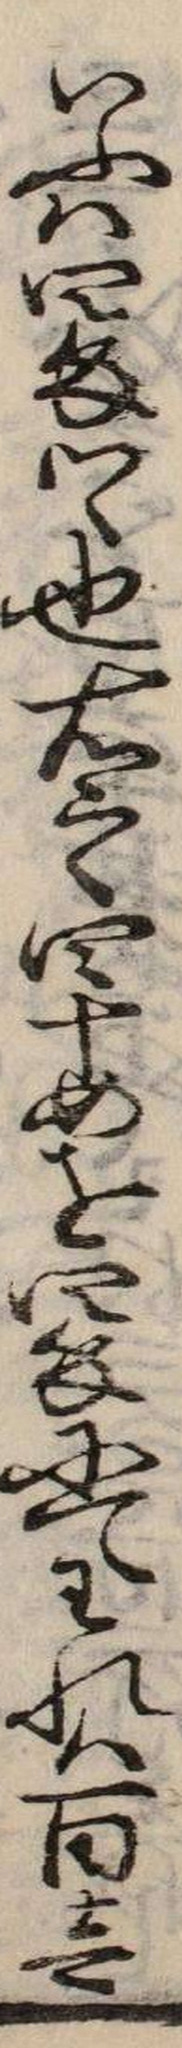いふは四匁つづ也右之四十めを四匁にてわれは百壱
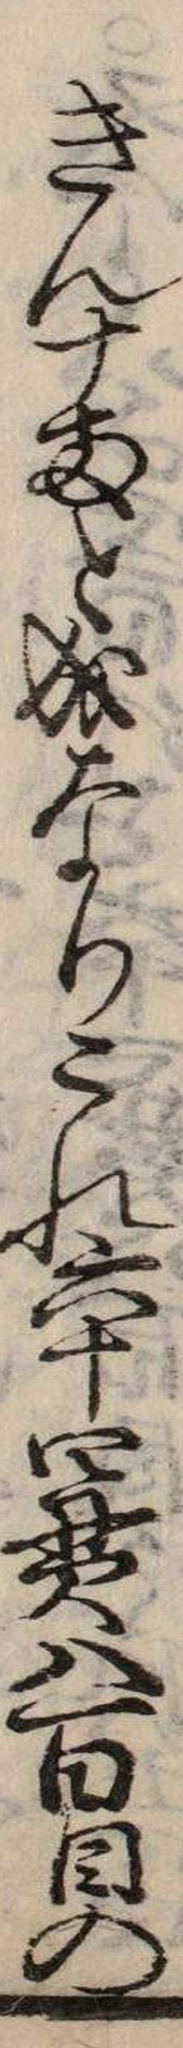きん十両と成なりこれ六十四貫八百目の
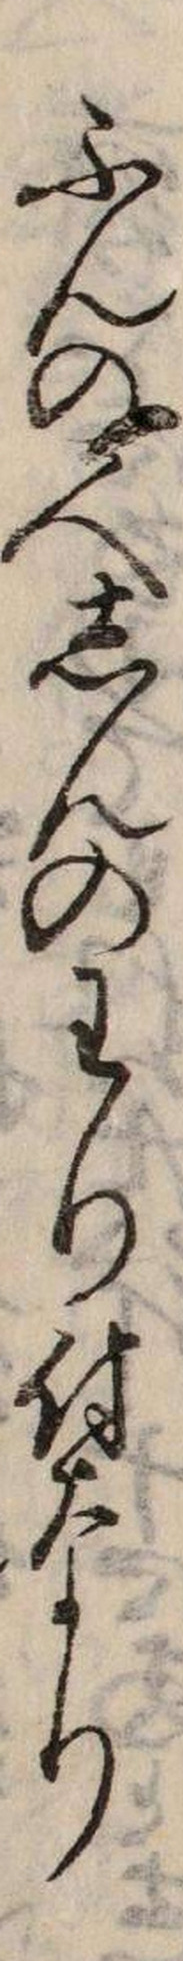ふんの人しんのわり付なり
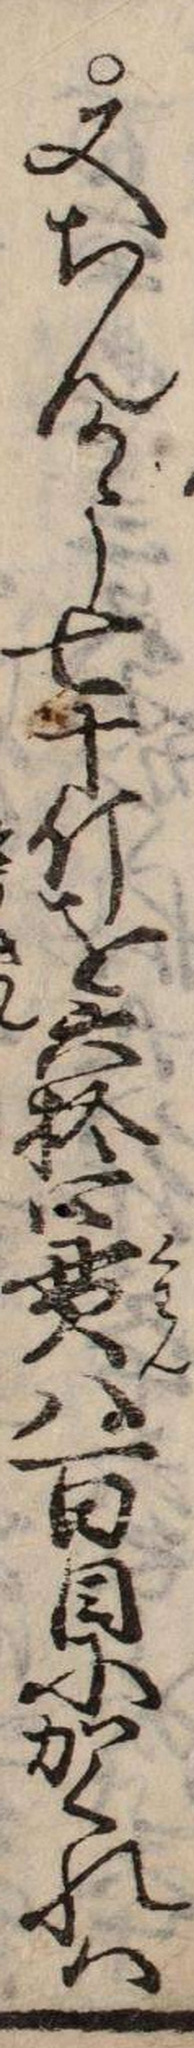○又ちんかう七十斤を六拾四貫八百目にかくれは
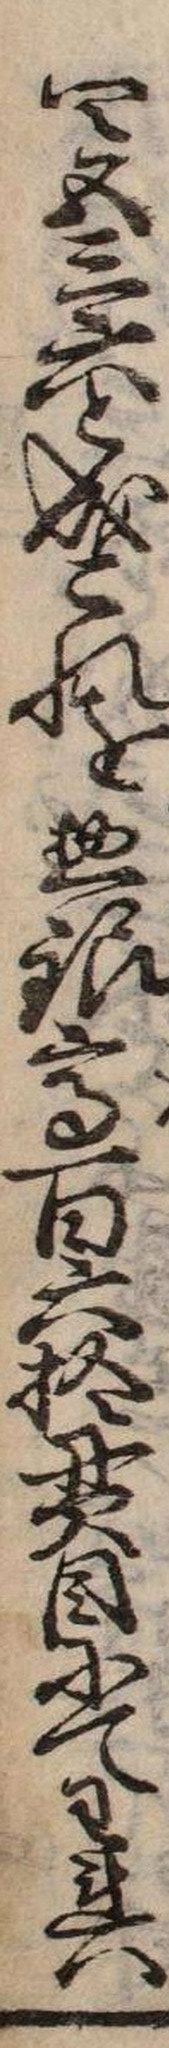四五三六と成これを惣銀高百六拾貫目にてわれは

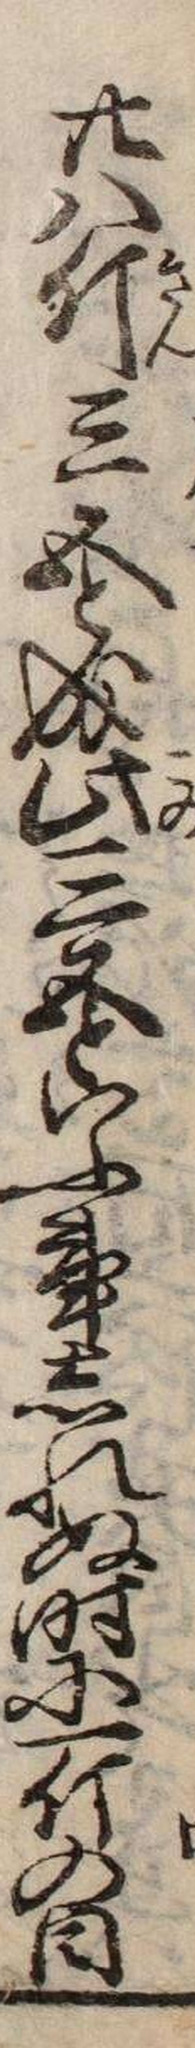廿八斤三五と成此三五といふ事しれぬ時に一斤の目
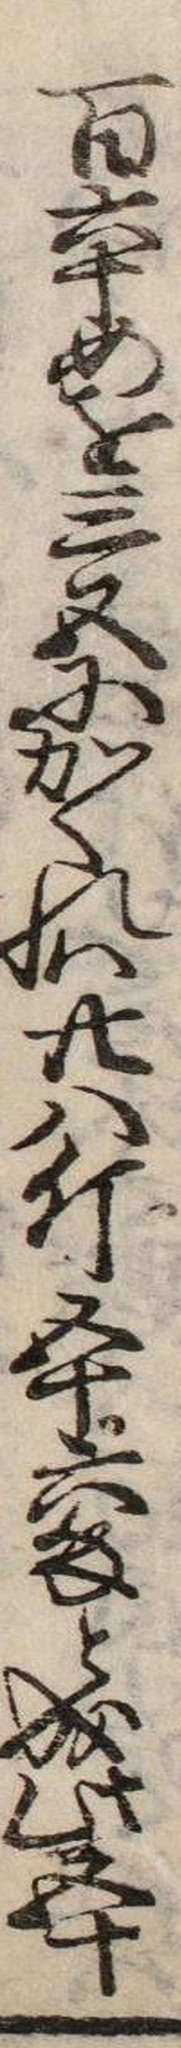百六十めを三五にかくれは廿八斤五十六匁と成此五十
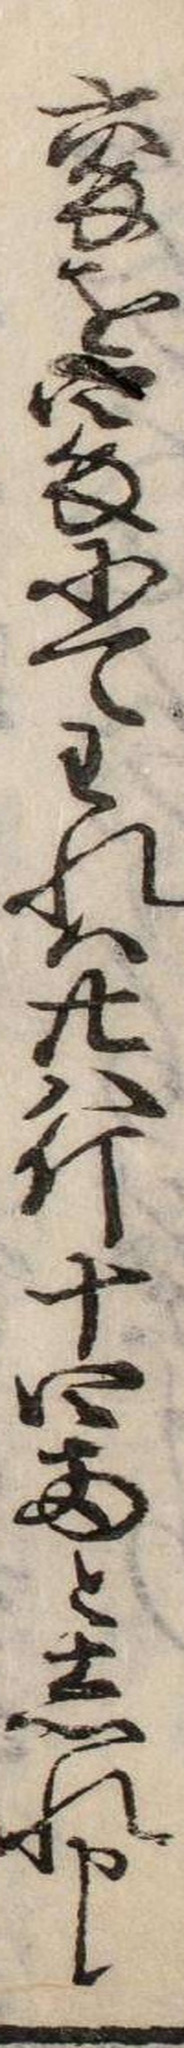六匁を四匁にてわれは廿八斤十四両としれ申候
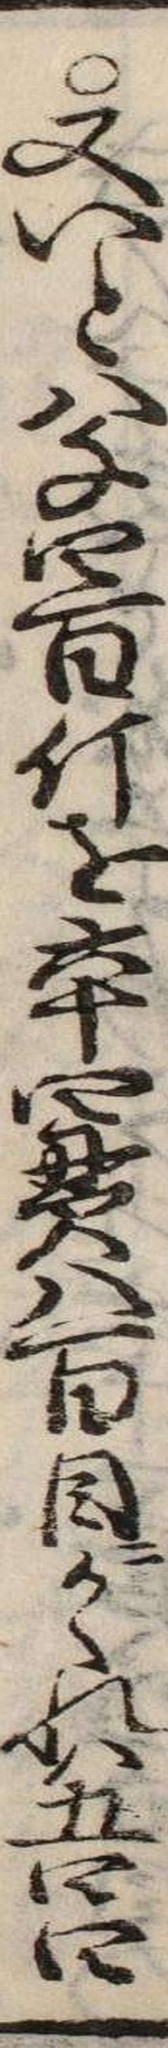◯又いと八千四百斤を六十四貫八百目にかくれは五四四
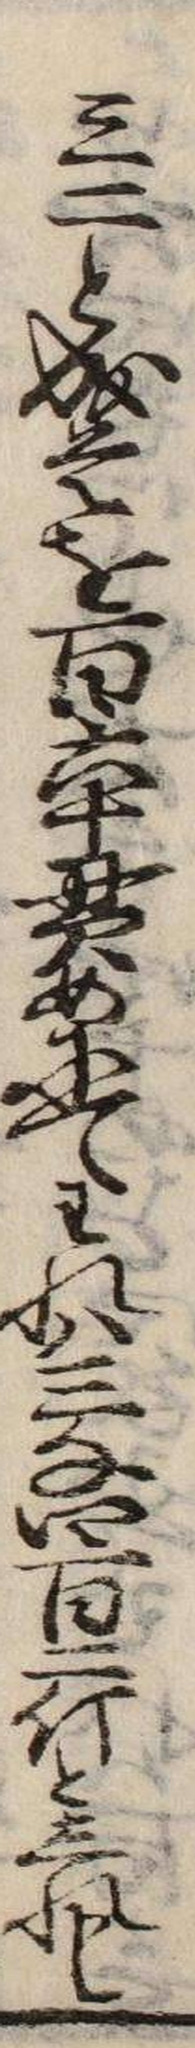三二と成是を百六十貫めにてわれは三千四百二斤としれ申候
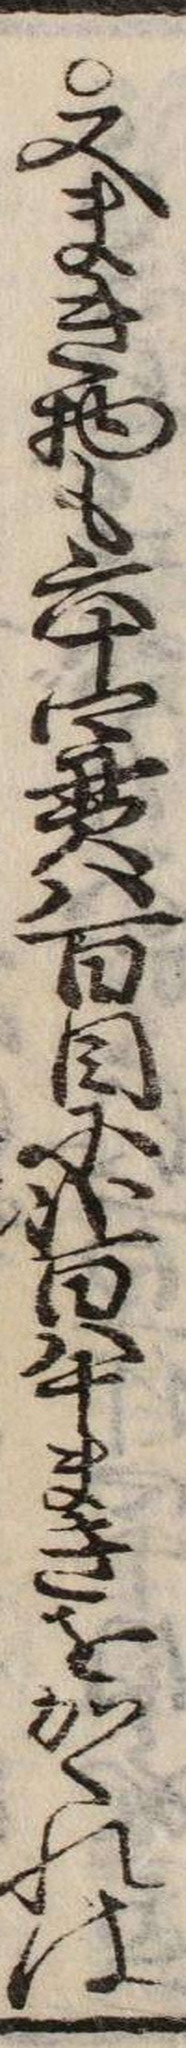○又まき物も六十四貫八百目に弐百八十まきをかくれは
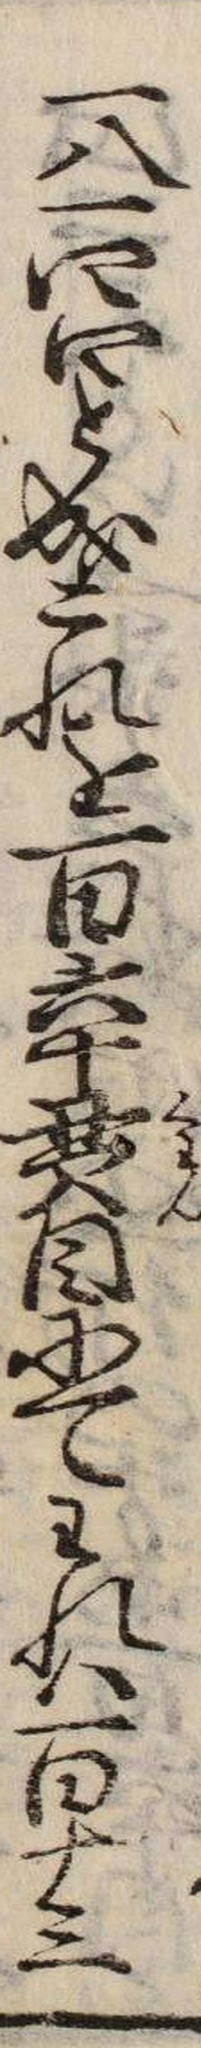一八一四四と成これを百六十貫目にてわれは百十三
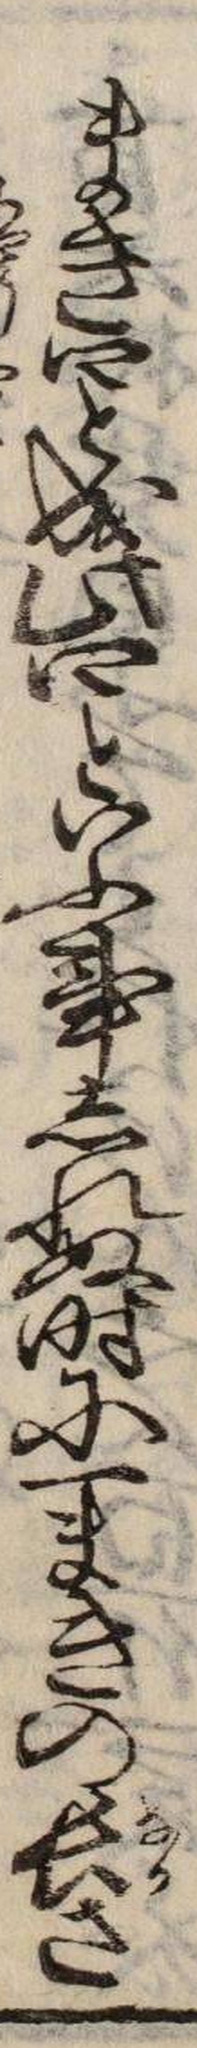まき四と成此四といふ事しれぬ時に一まきの長さ
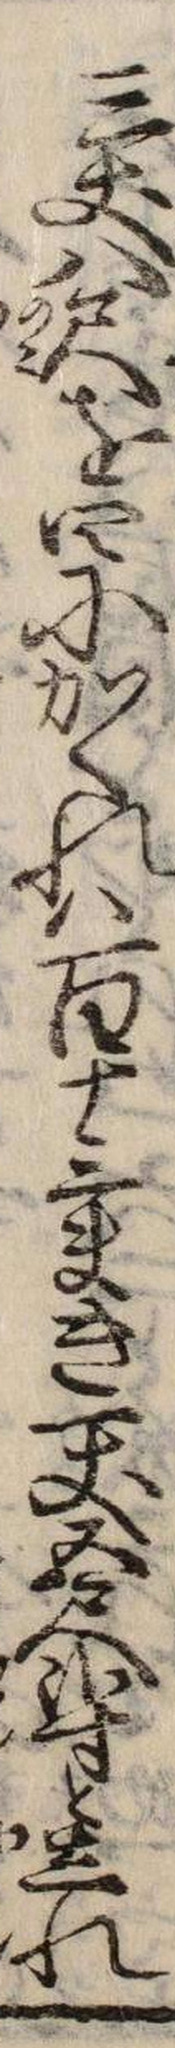三丈八尺を四にかくれは百十三まき一丈五尺弐寸としれ申候
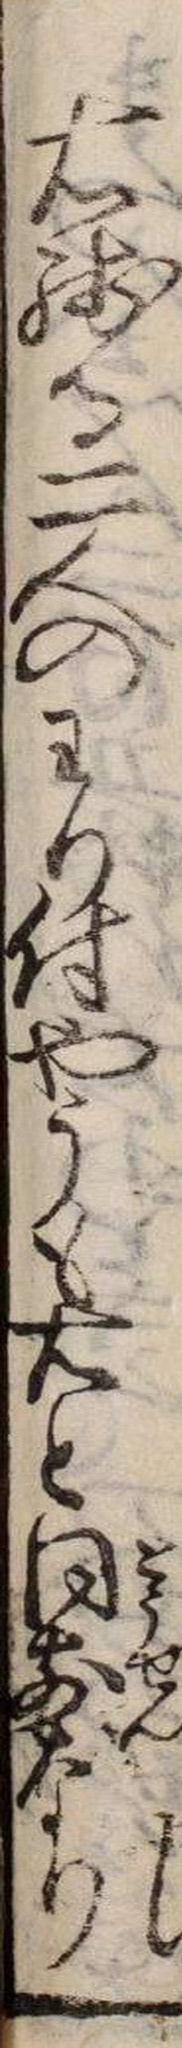右残る二人のわり付やうも右と同前なり
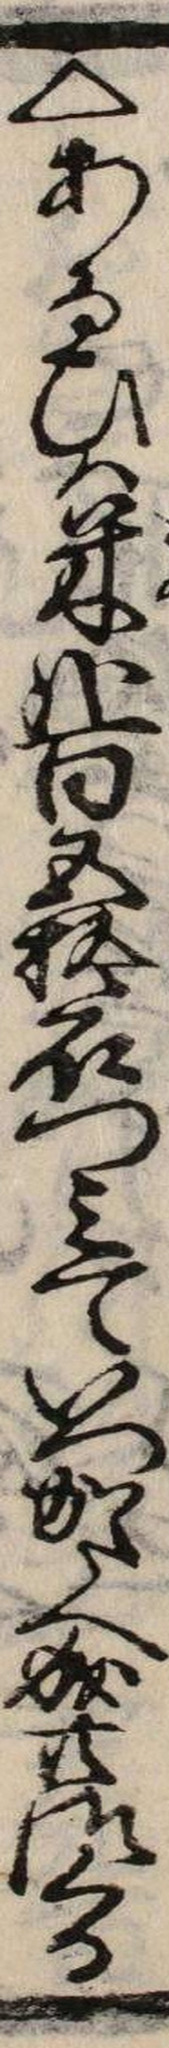△あるひは米弐百五拾石つみていつかたへ成共つくる
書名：塵劫記（寛永11年自跋、京都府立京都学・歴彩館追貴8）
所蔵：京都府立京都学・歴彩館 国文学研究資料館
